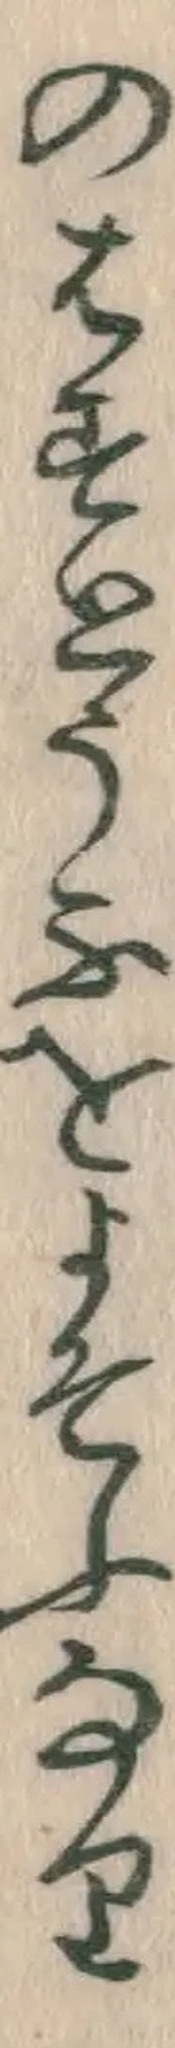のはすとうふをよそふなり
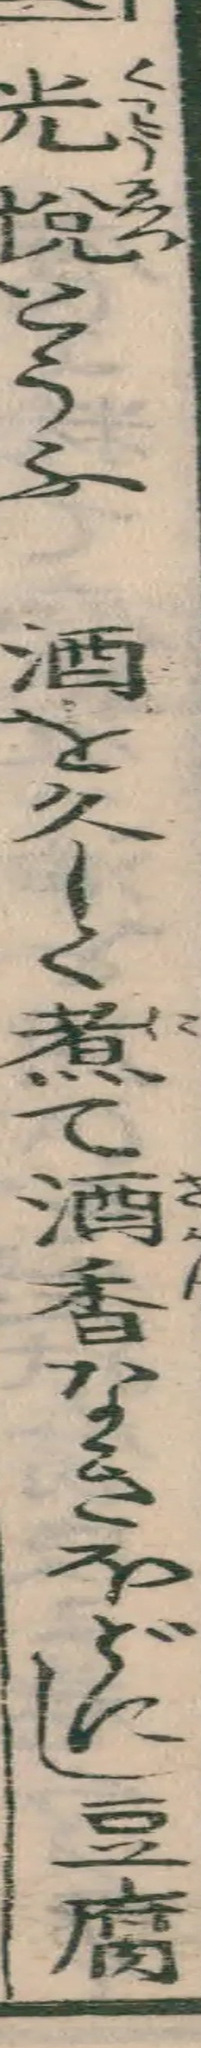[七十六]光悦とうふ酒を久しく煮て酒香なきほどにし豆腐
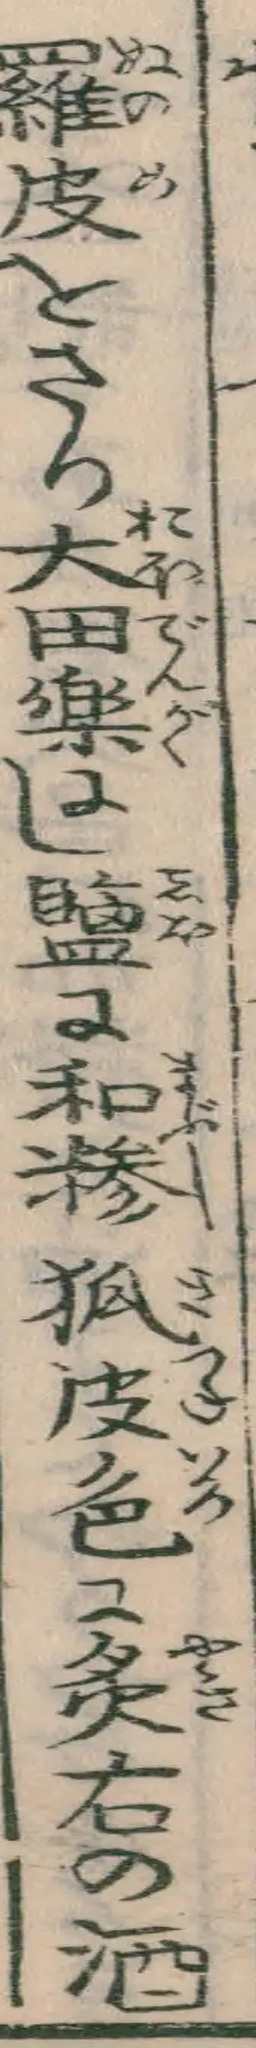羅皮をさり大田楽にし鹽に和糝狐皮色に炙右の酒
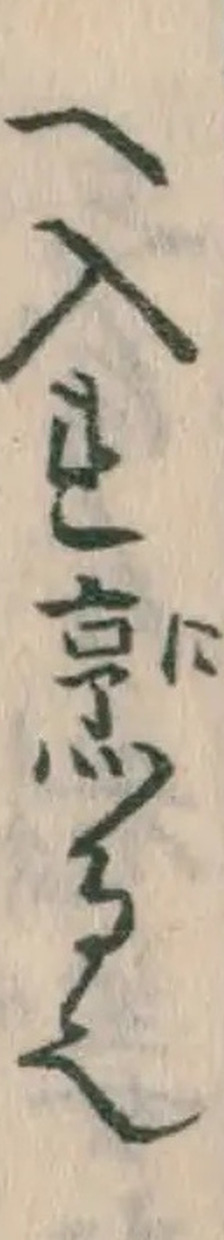へ入れ烹る也
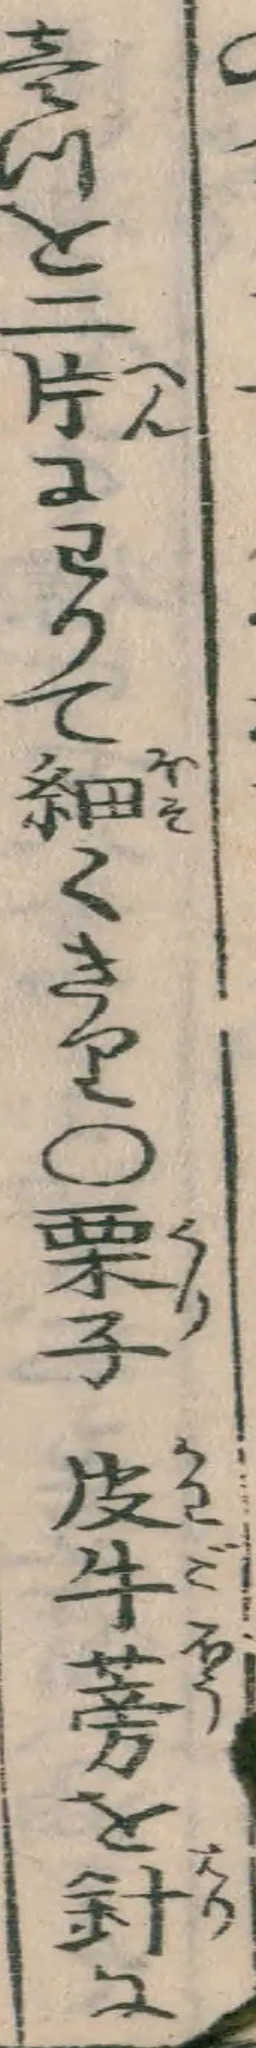壱つを二片にわりて細くきり○栗子皮牛蒡を針に
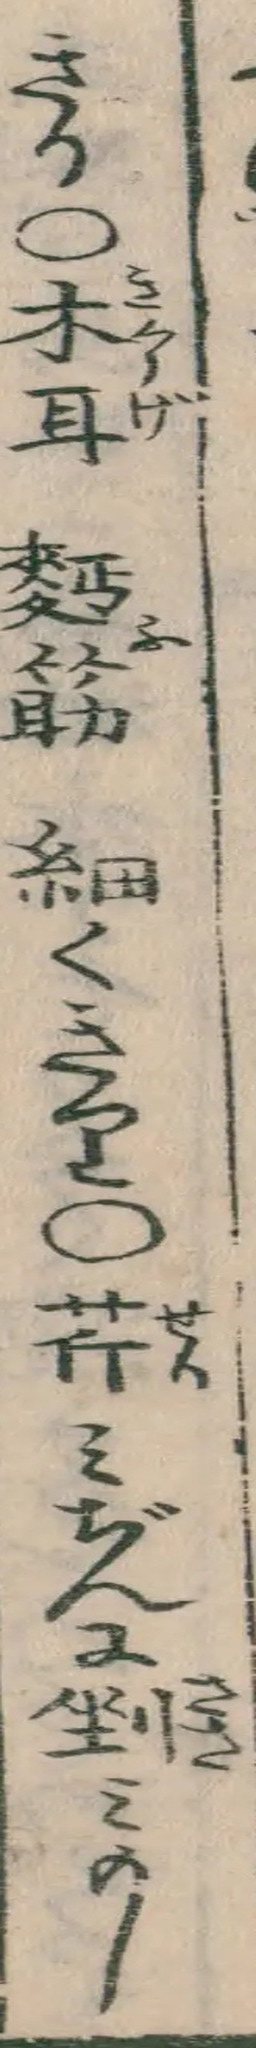きり○木耳麪筋細くきり○芹みぢんに剉みもし
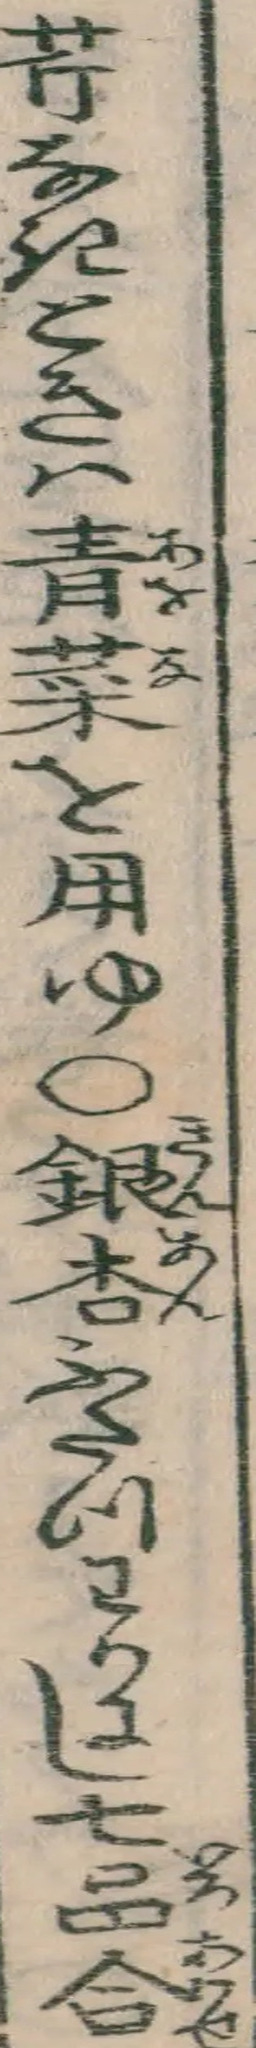芹なきときは青菜を用ゆ○銀杏ふたつわりにし七品合
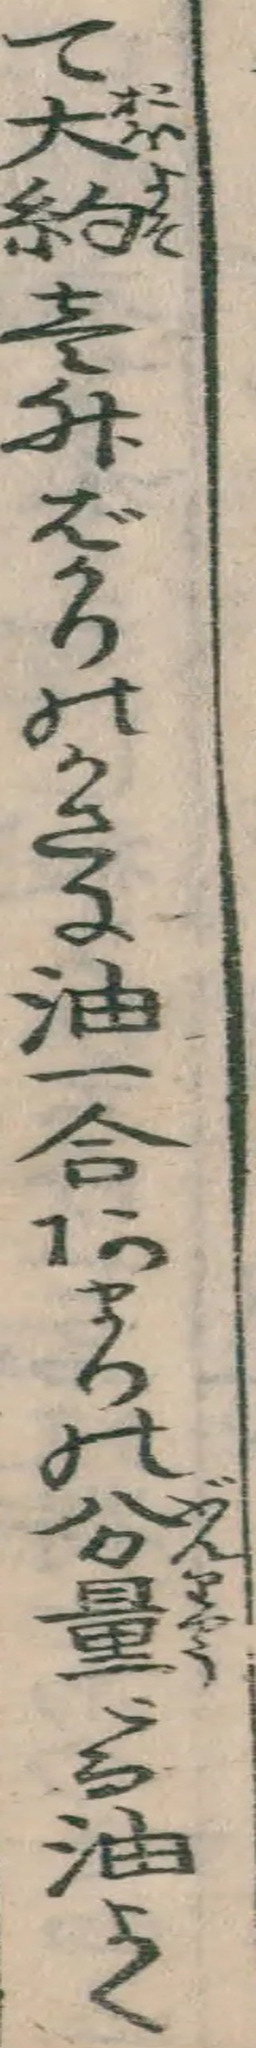て大約壱升ばかりのかさに油一合あまりの分量にて油よく
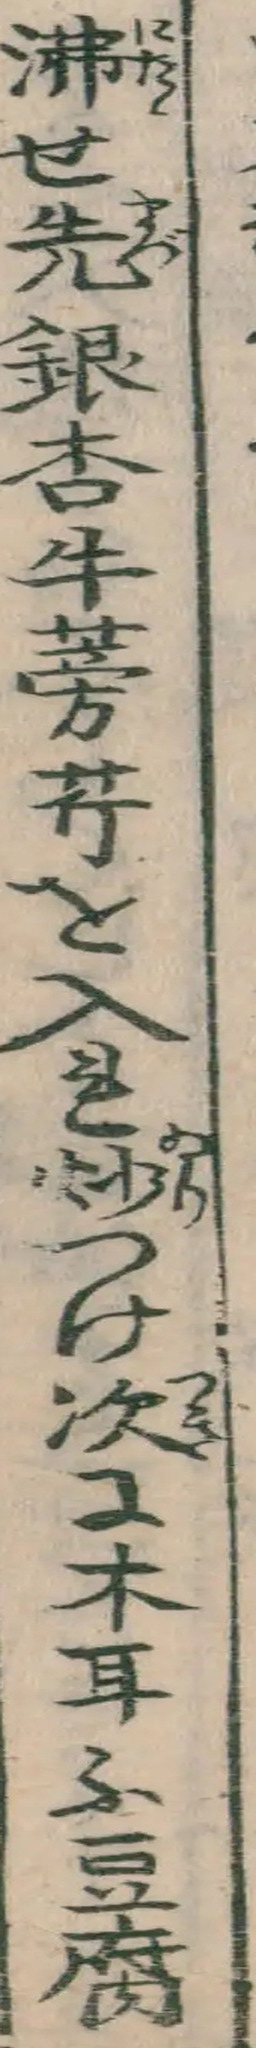沸せ先銀杏牛蒡芹を入れ炒つけ次に木耳ふ豆腐

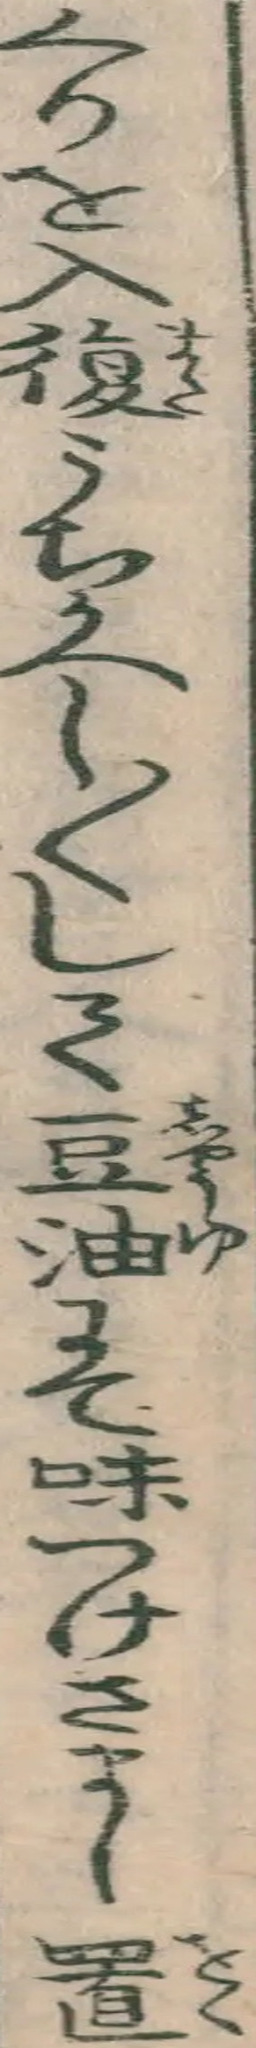くりを入れ復うち久しくして豆油にて味つけさまし置
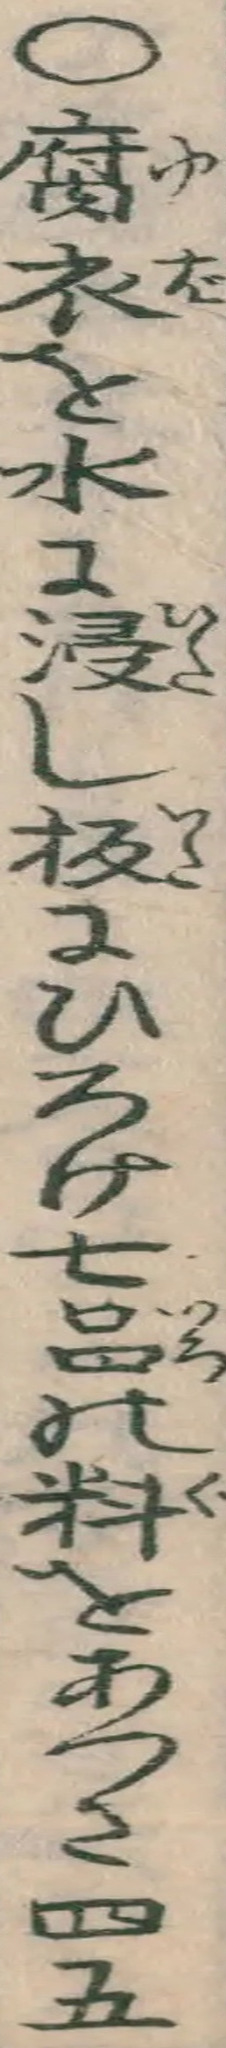○腐衣を水に浸し板にひろけ七品の料をあつさ四五
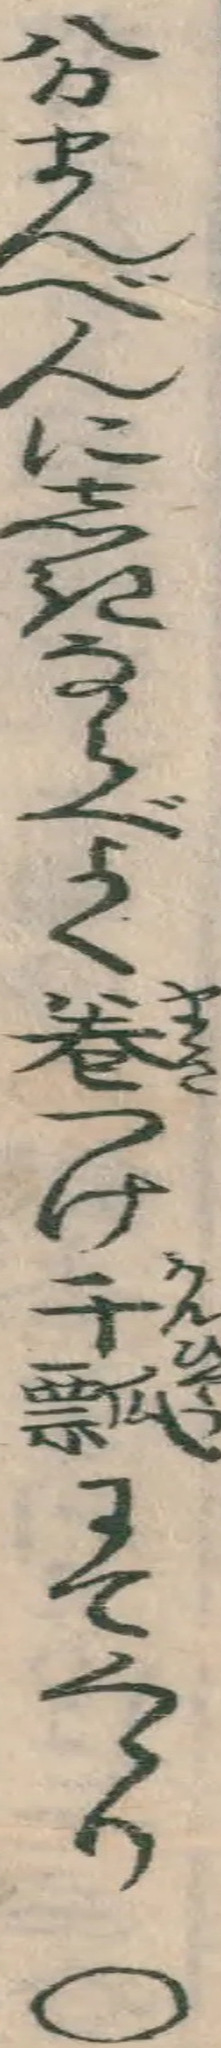分まんべんにしきならべよく巻つけ干瓢にてくゝり○
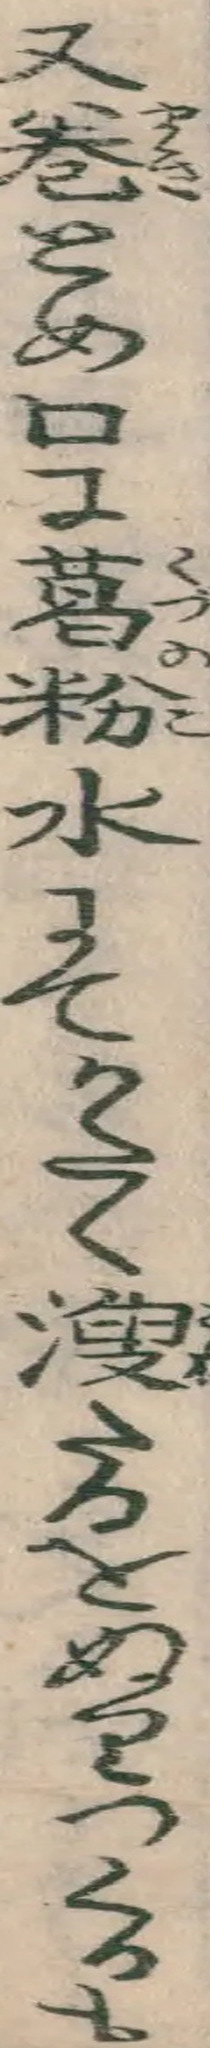又巻とめ口に葛粉水にてかたく溲たるをぬりつくるも
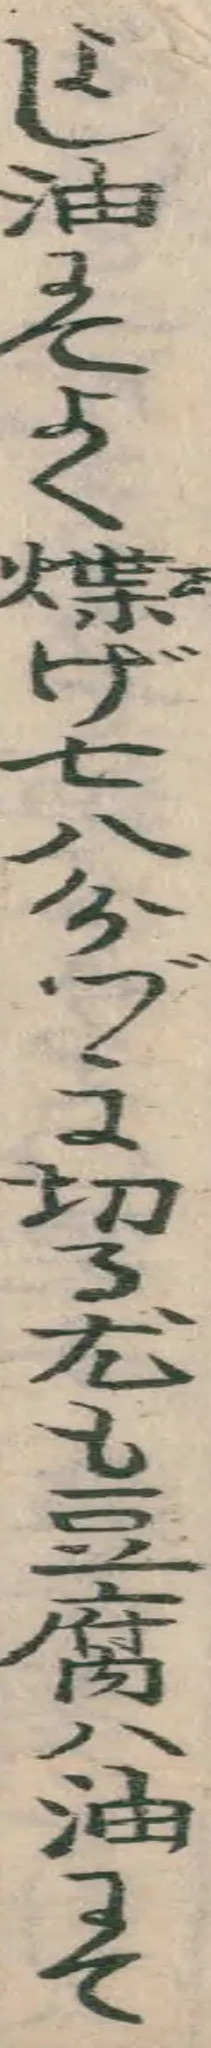よし油にてよく煠げ七八分づゝに切る尤も豆腐は油にて
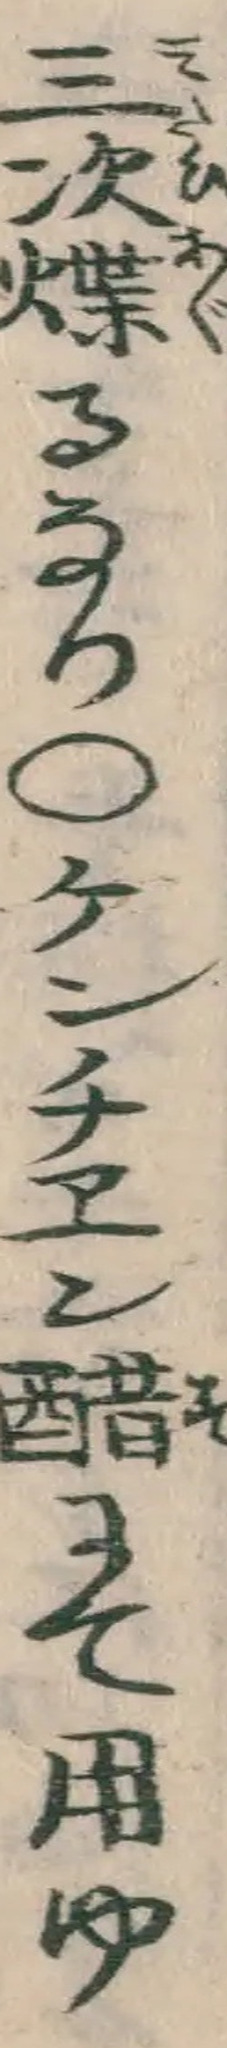三次煠るなり○ケンチヱン醋にて用ゆ
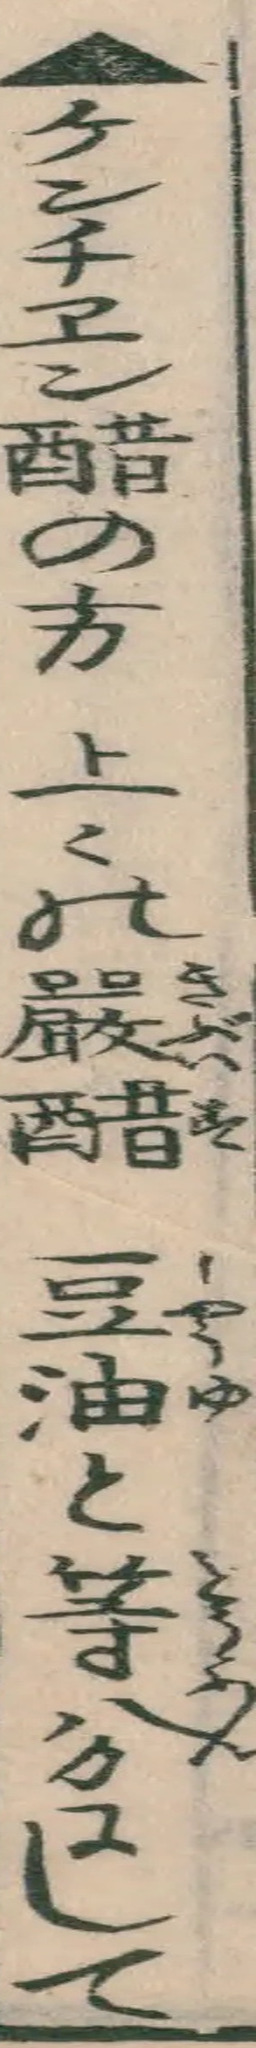▲ケンチヱン醋の方上々の厳醋豆油と等分にして
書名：豆腐百珍. [正編]
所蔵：国立国会図書館 National Diet Library, JAPAN
